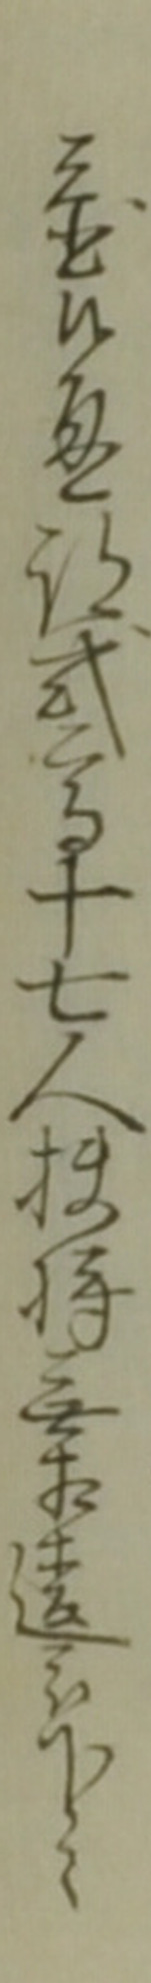置候通跡式高十七人扶持無相違被下之
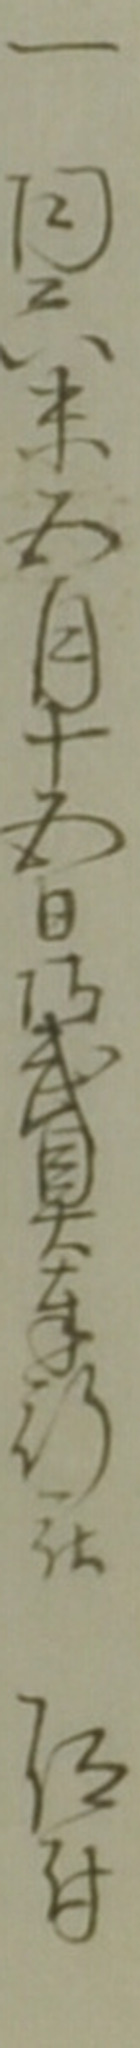一同六未五月十五日御武具奉行被仰付
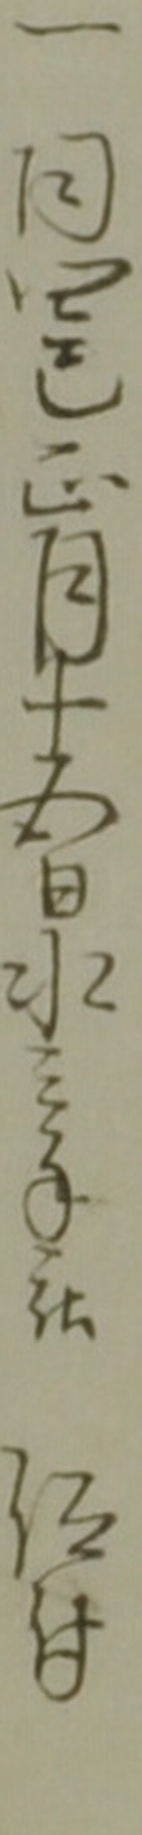一同四巳正月十五日水之手被仰付
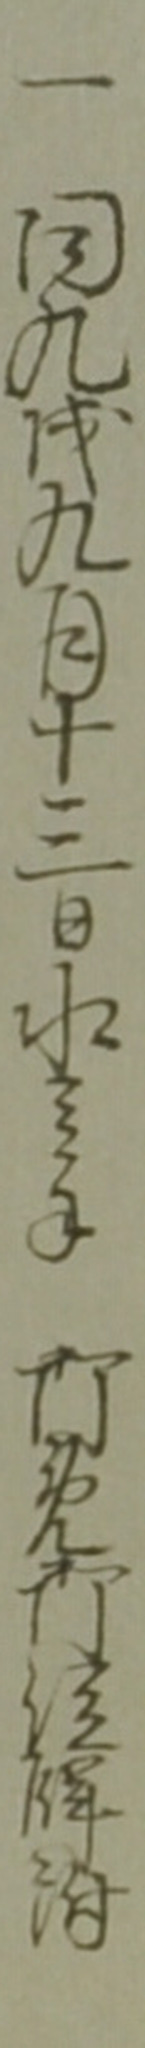一同九戌九月十三日水之手御免御位牌附
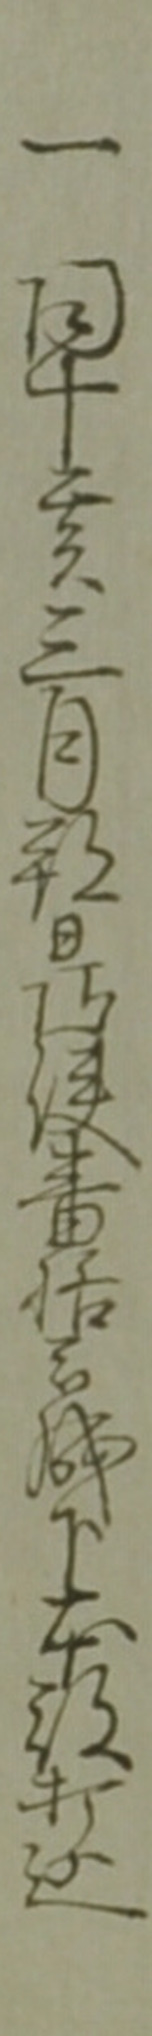一同十亥三月朔日御使番格被成下本役打込
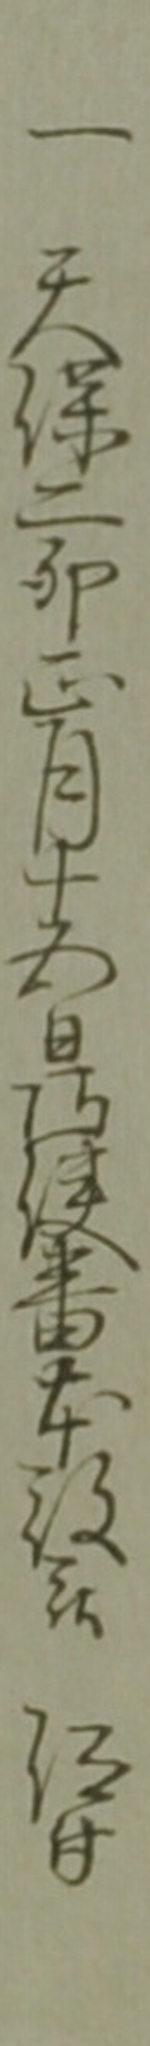一天保二卯正月十五日御使番本役被仰付
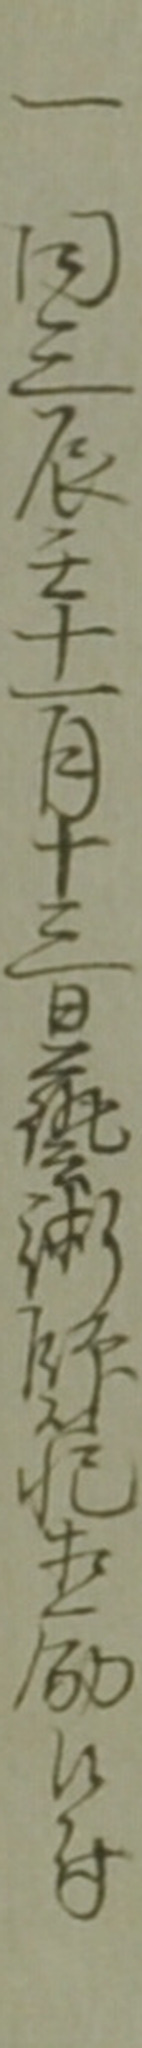一同三辰閏十一月十三日芸術師範相励候付
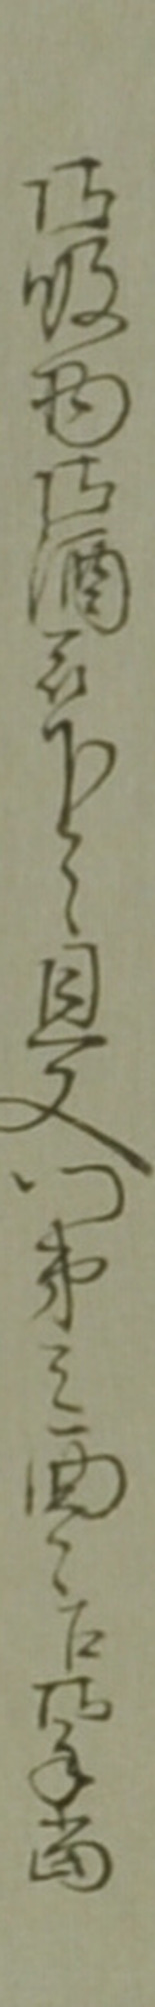御吸物御酒被下之且又門弟之面々え御手当
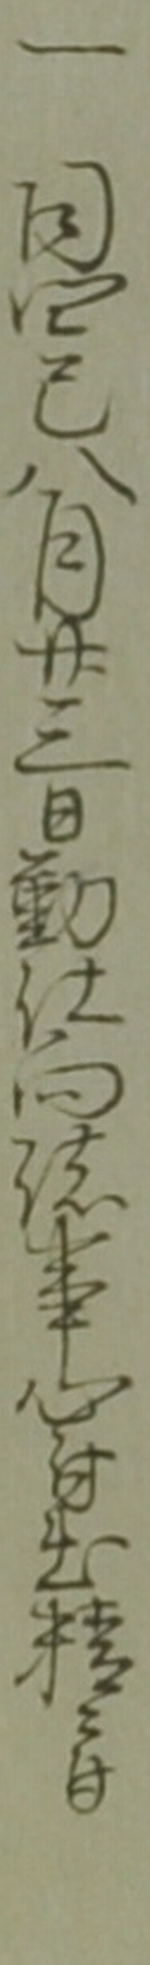一同四巳八月廿三日勤仕向諸事心付出精ニ付
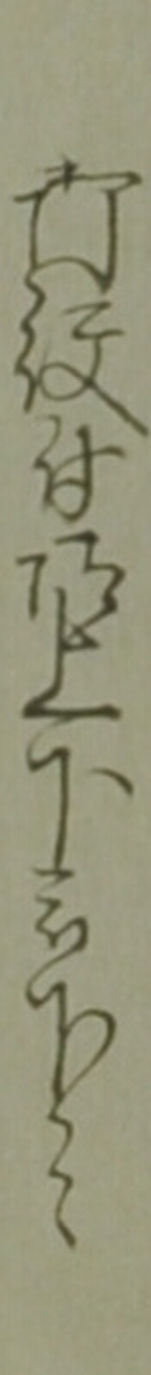御紋付御上下被下之
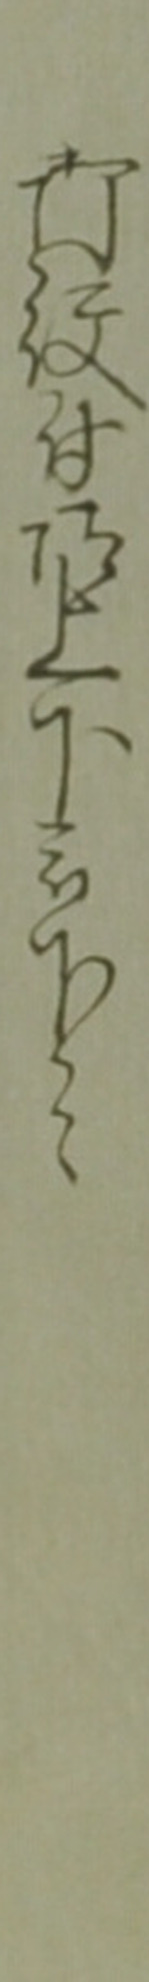御紋付御上下被下之
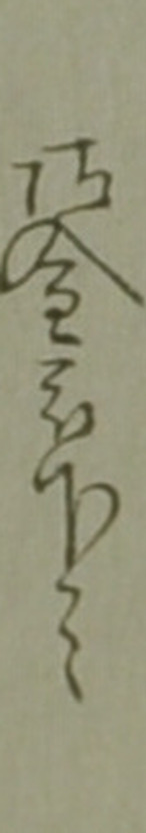御金被下之
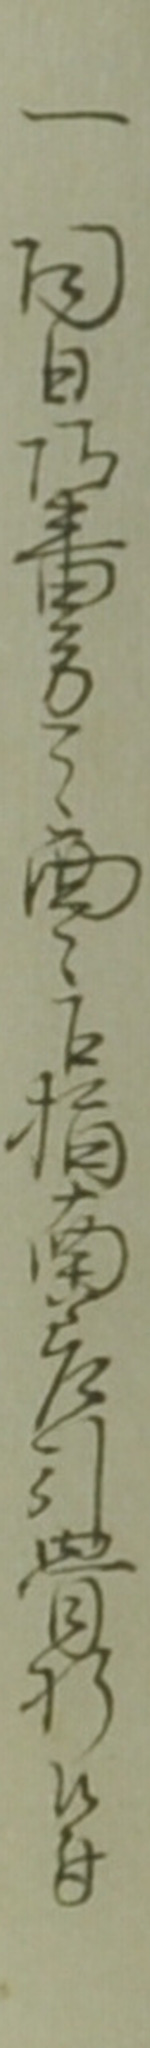一同日御番方之面々え指南差引骨折候付
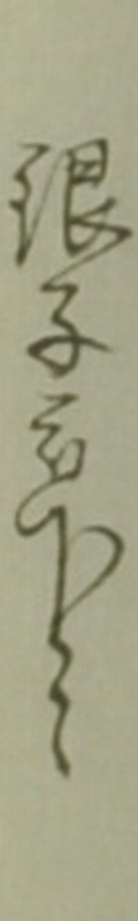銀子被下之

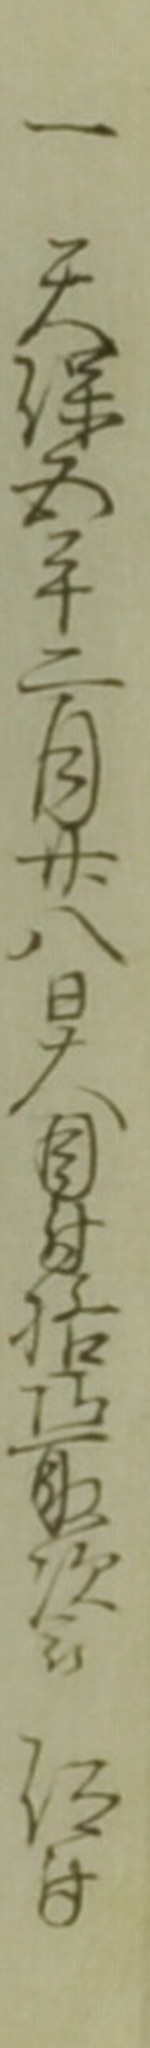一天保五午二月廿八日大目付格御取次被仰付
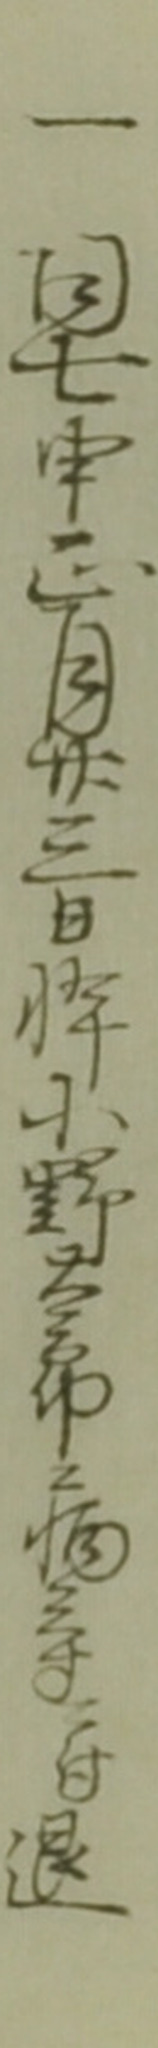一同七申正月廿三日忰小野太郎病気ニ付退
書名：給人諸士勤仕録（三）
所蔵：伊那市立高遠町図書館・合同会社AMANE
